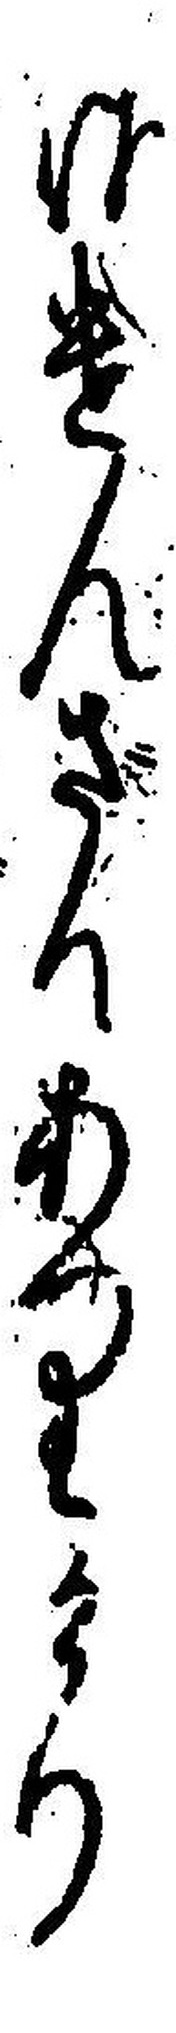御けんざんありけり

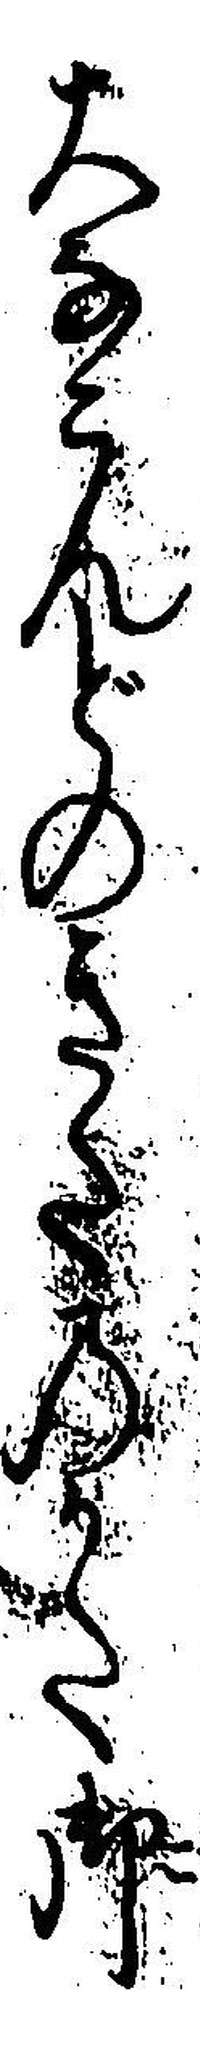大なこんどのきたのかた御
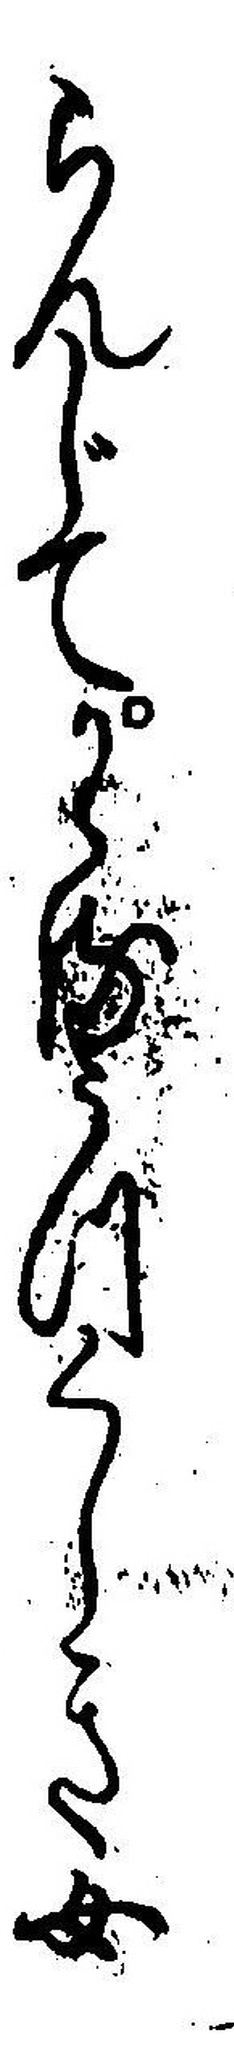らんじて。かゝるうつくしき女
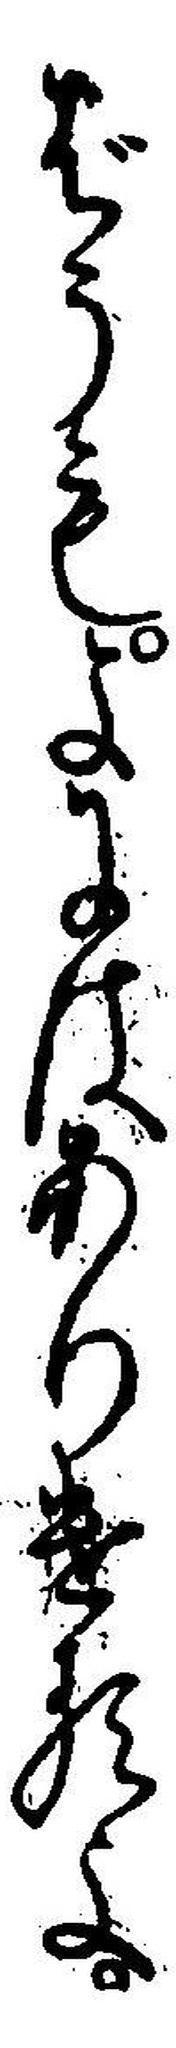ばうも。よにはありけるよ。
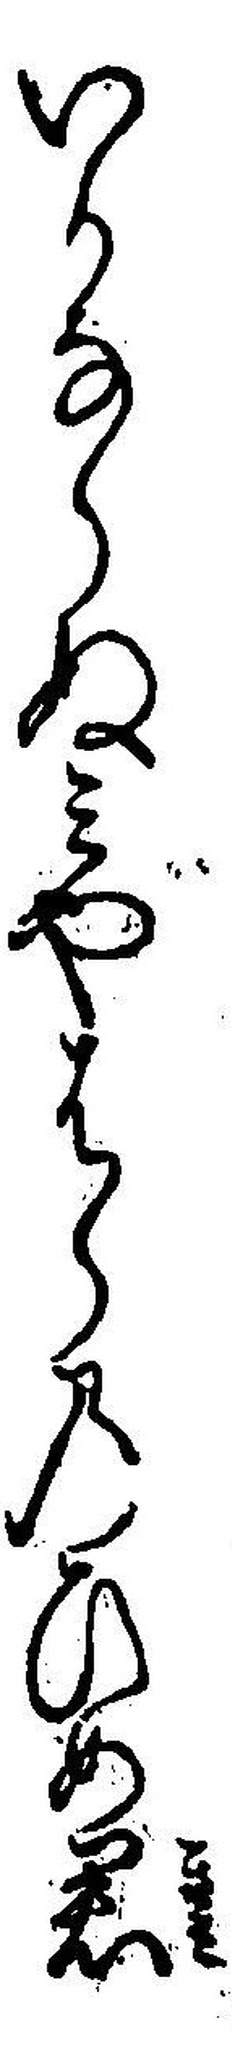いかならぬみやはらのひめ君
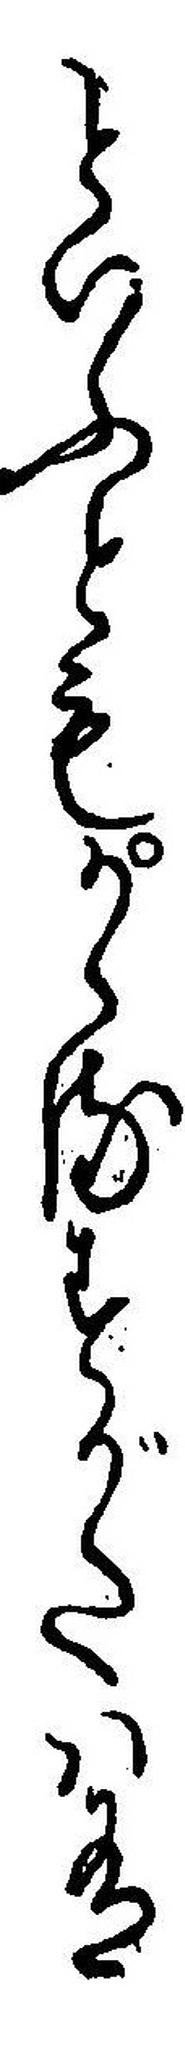といふとも。かゝるすがたは有
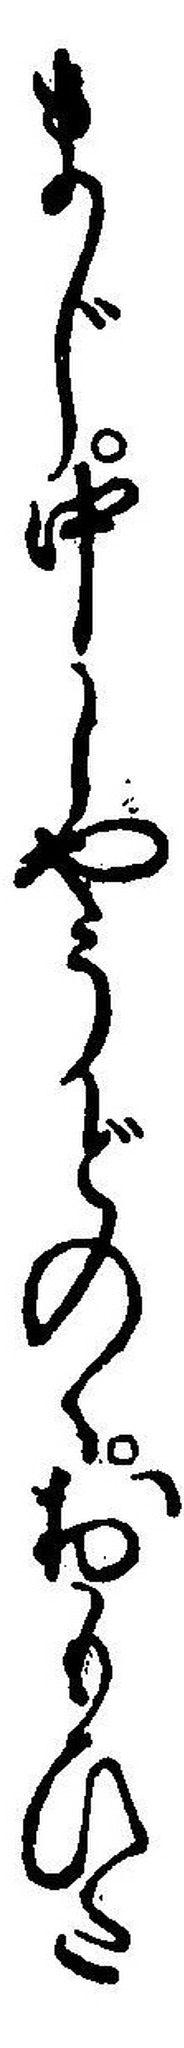まじ。中しやうどのゝ。おもひた
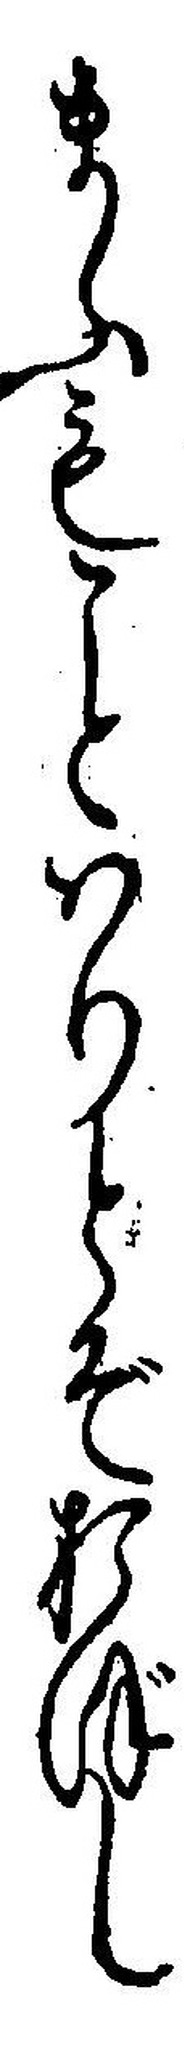まふもことはりとぞおぼし
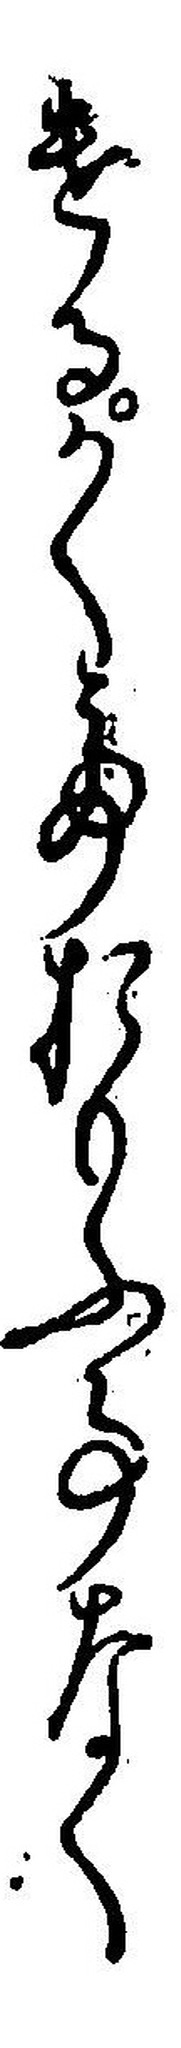ける。かくておもふ事なく
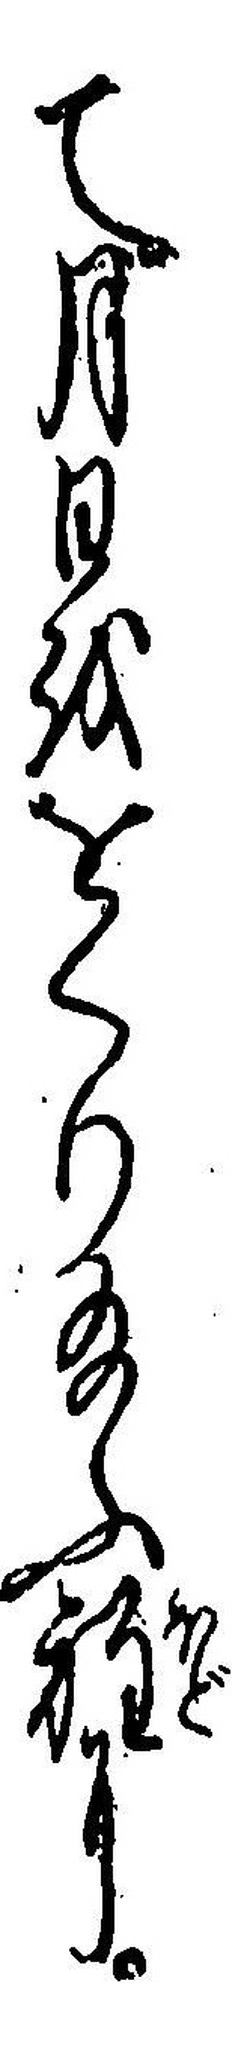て。月日ををくり給ふ程に。
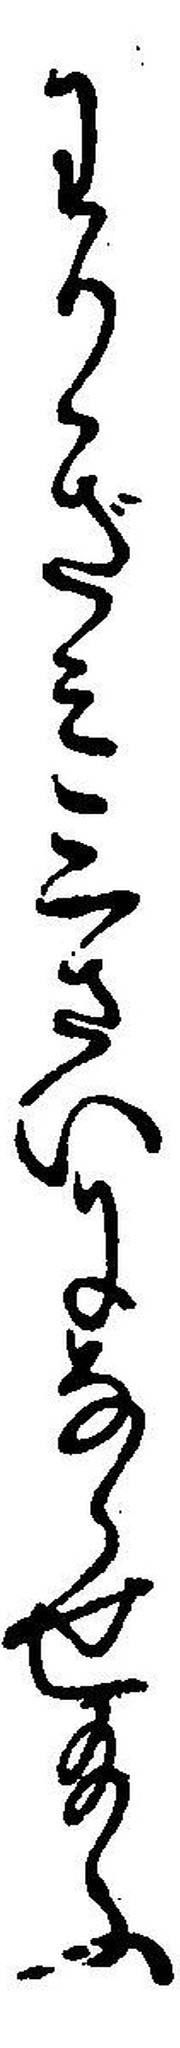わかぎみ三さいにならせ給ふ
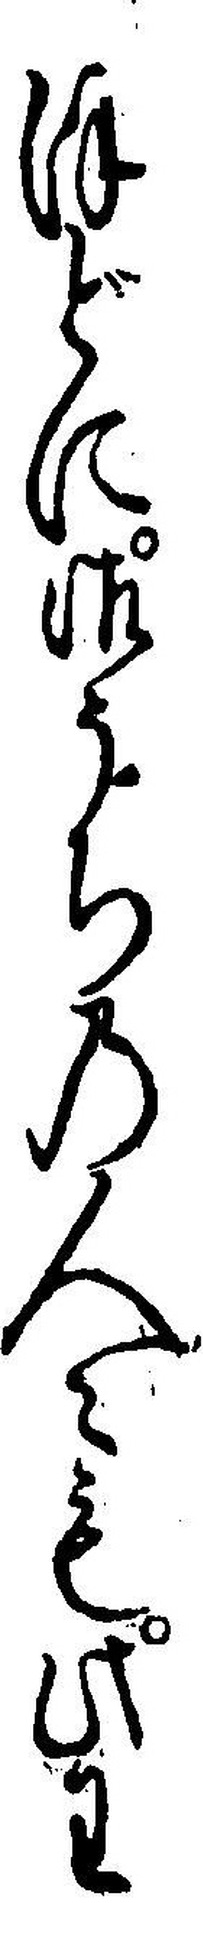ほどに。御うちの人にも。此わ
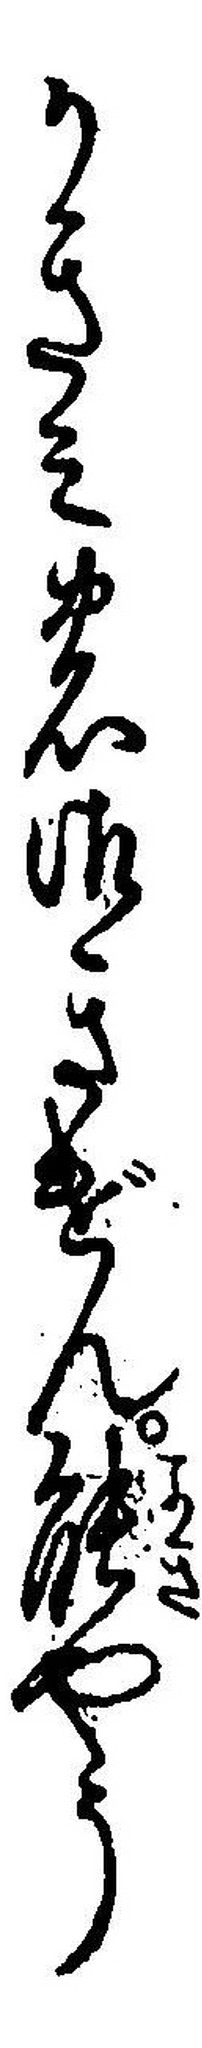かきみの御きげん。能やう
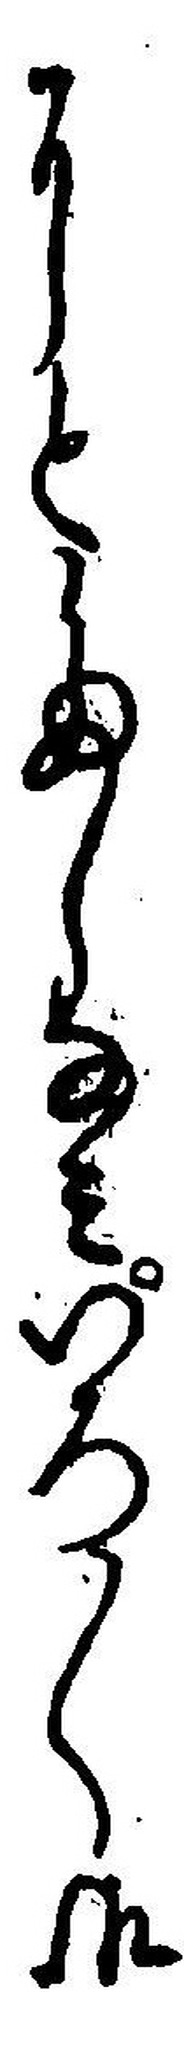にとたしなみ。いろ〳〵御
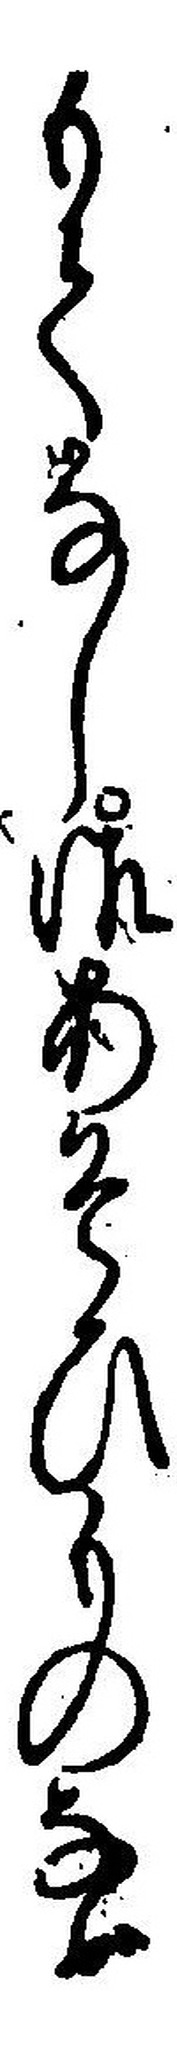もてなし。御あそひものなど
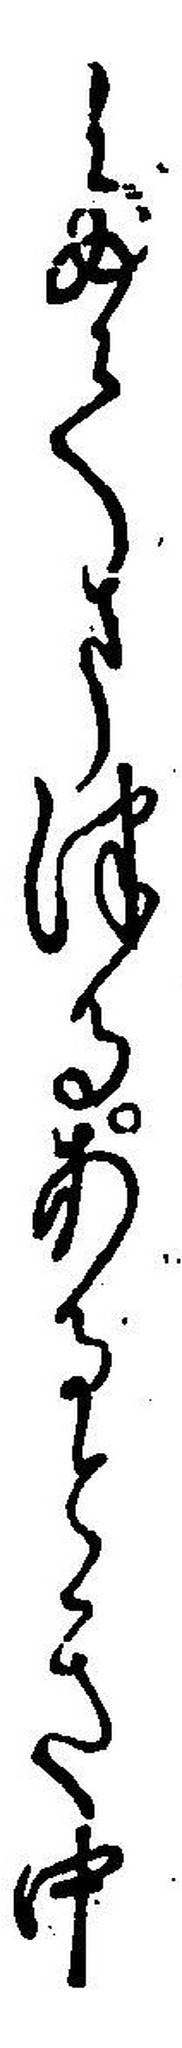たてまつる。あるとき中
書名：木幡きつね
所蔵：東京大学総合図書館 General Library in the University of Tokyo, JAPAN
